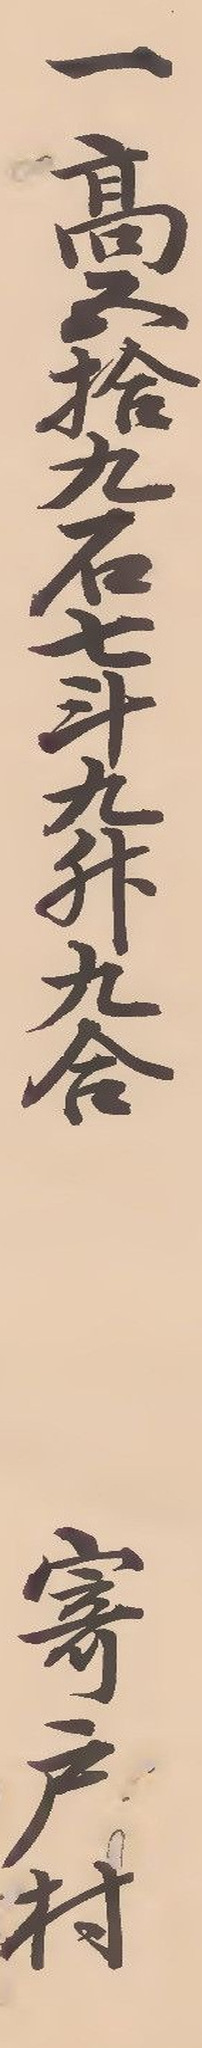一高五拾九石七斗九升九合寄戸村
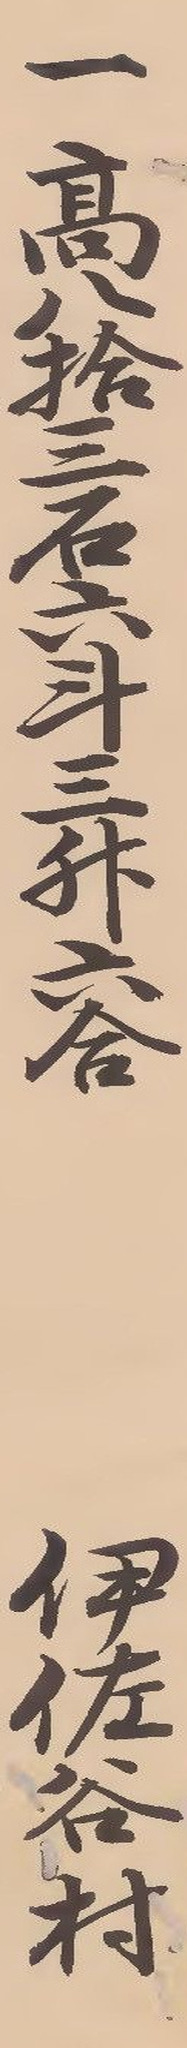一高八拾三石六斗三升六合伊佐谷村
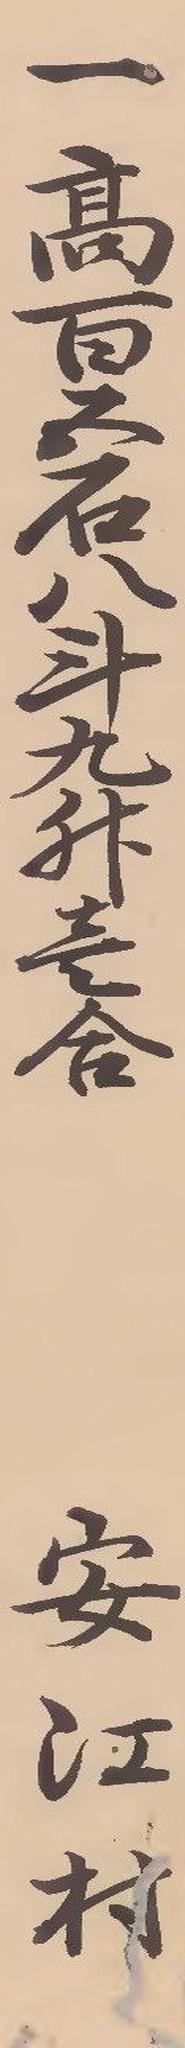一高百五石八斗九升壱合安江村
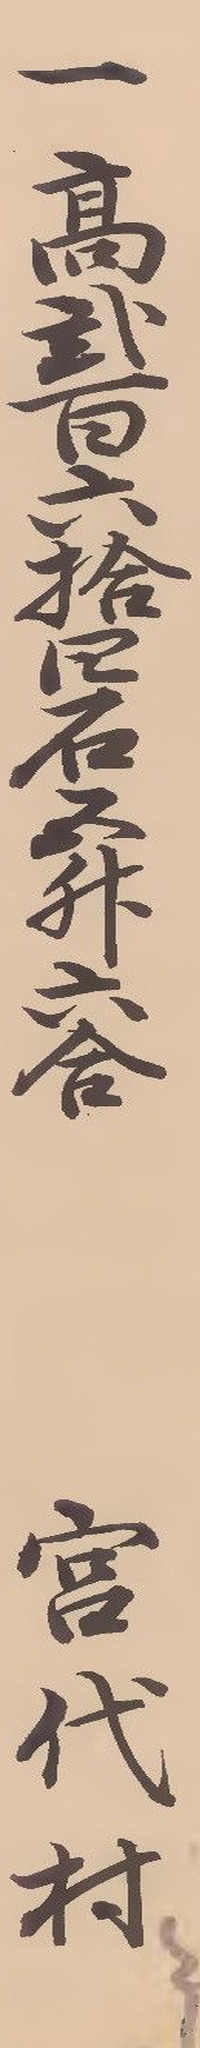一高弐百六拾四石五升六合宮代村
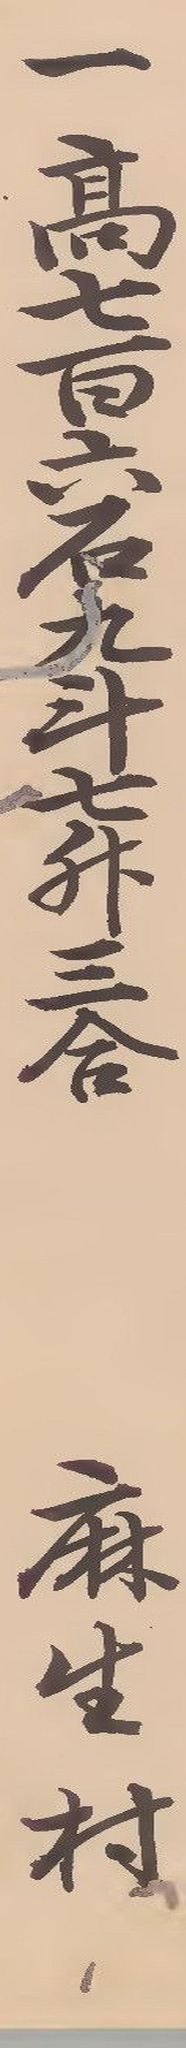一高七百六石九斗七升三合麻生村

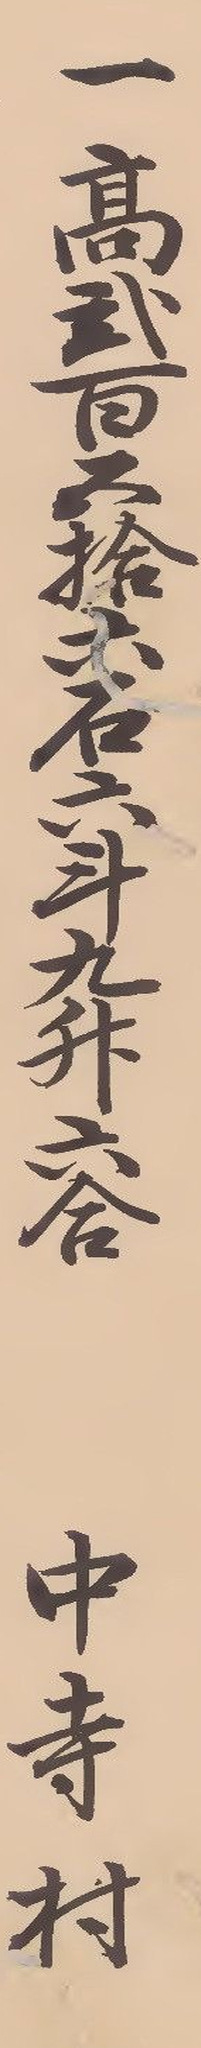一高弐百五拾六石六斗九升六合中寺村
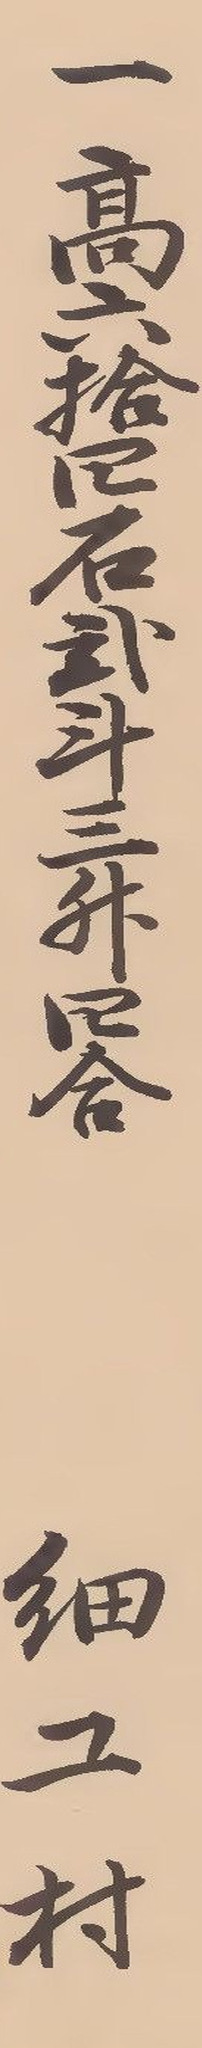一高六拾四石弐斗三升四合細工村
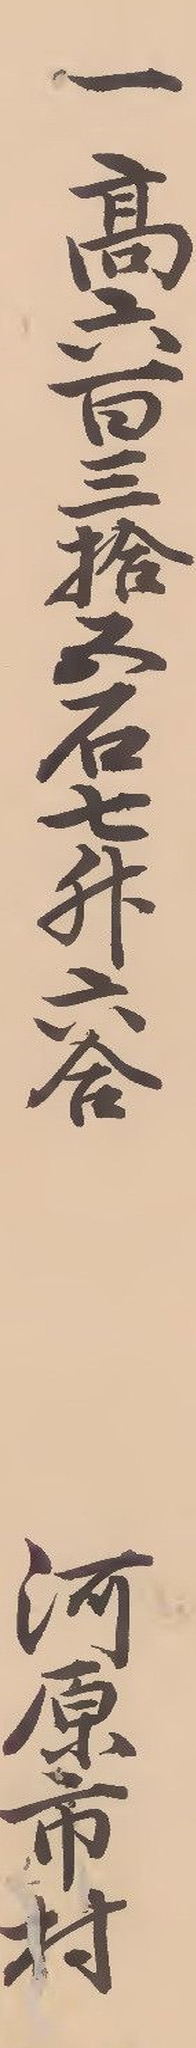一高六百三拾五石七升六合河原市村
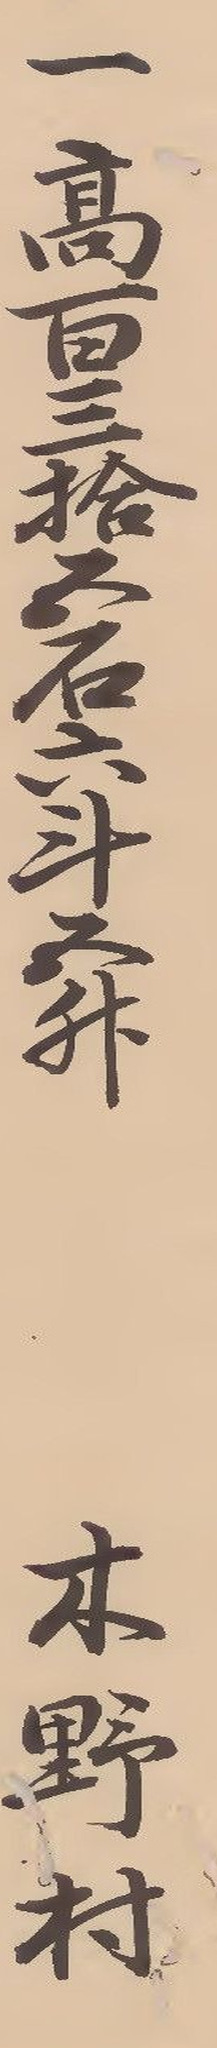一高百三拾五石六斗五升木野村
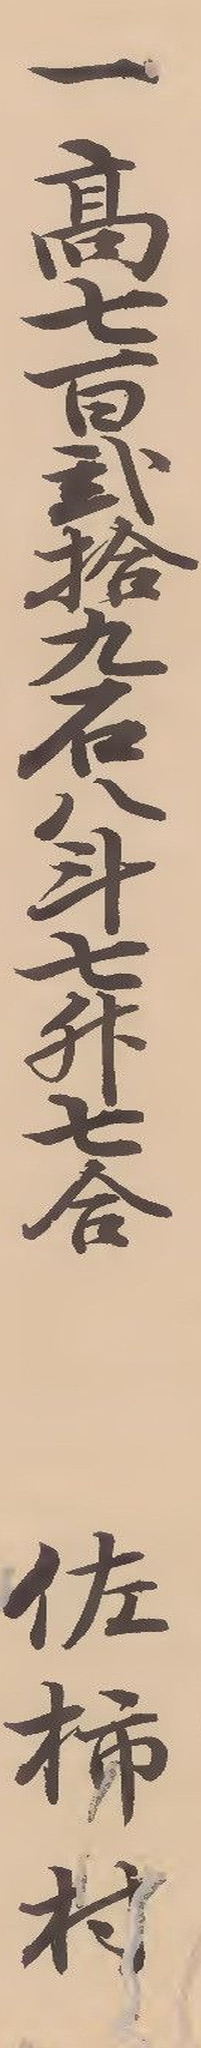一高七百弐拾九石八斗七升七合佐柿村
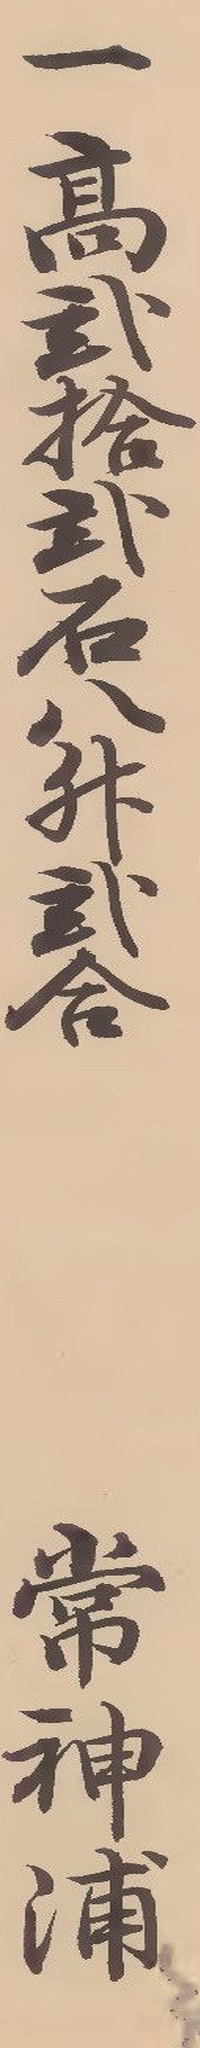一高弐拾弐石八升弐合常神浦

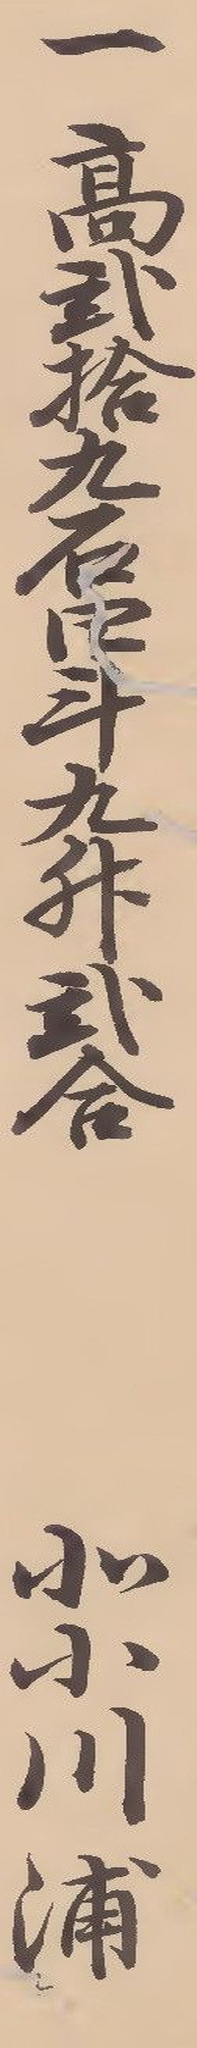一高弐拾九石四斗九升弐合北小川浦
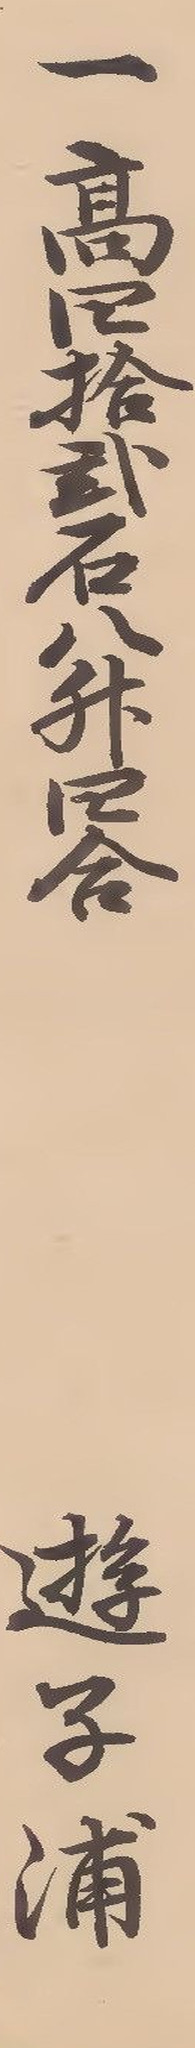一高四拾弐石八升四合遊子浦
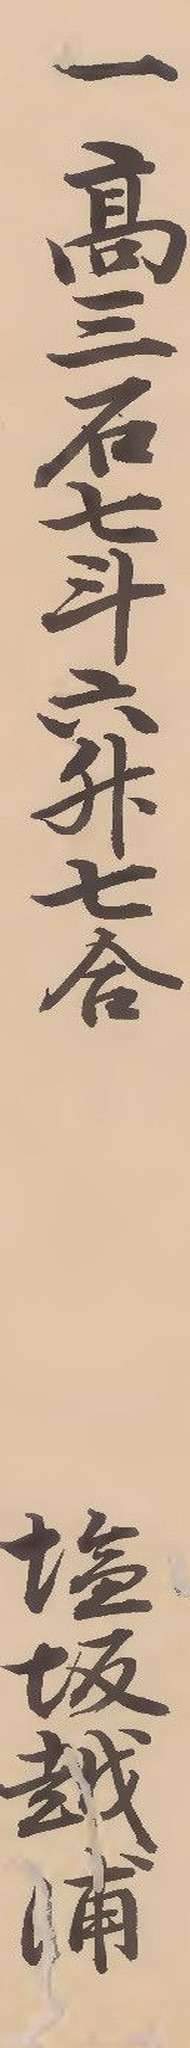一高三石七斗六升七合塩坂越浦
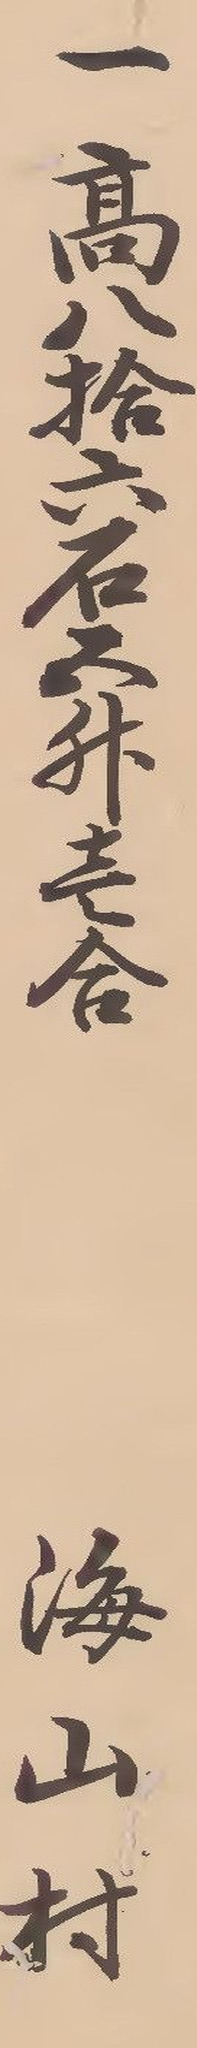一高八拾六石五升壱合海山村
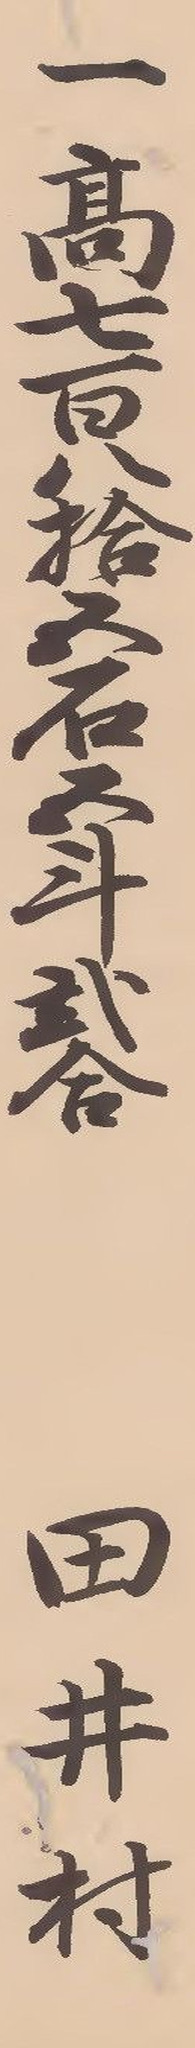一高七百八拾五石五斗弐合田井村
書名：若狭国郷帳
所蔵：国立公文書館 National Archives of Japan
